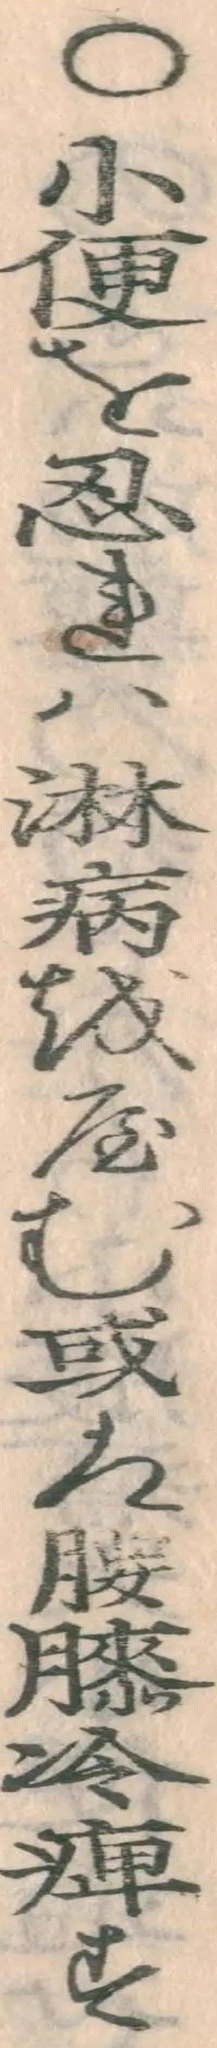〇小便を忍れは淋病をやむ或は腰膝冷痺す
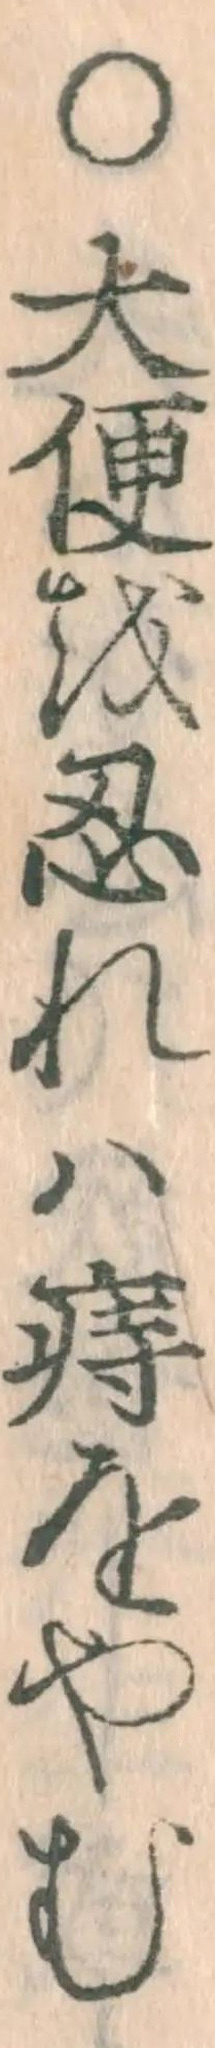〇大便を忍れは痔をやむ

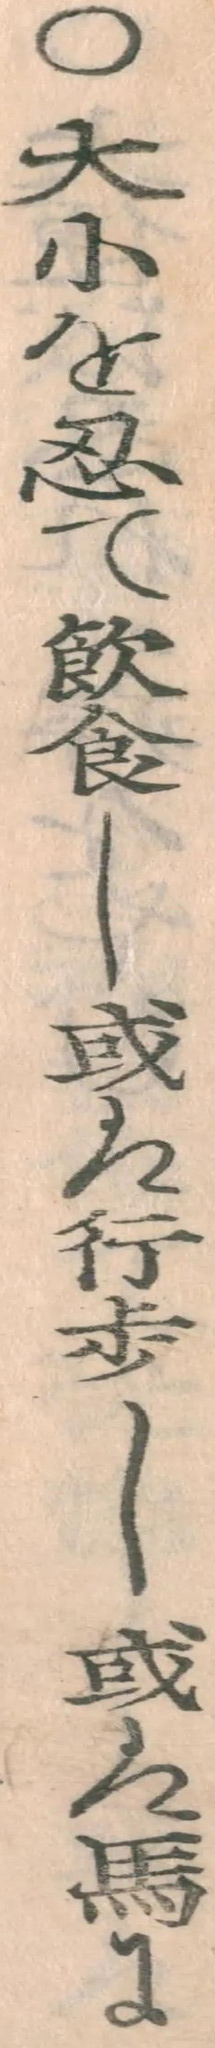〇大小を忍て飲食し或は行歩し或は馬に
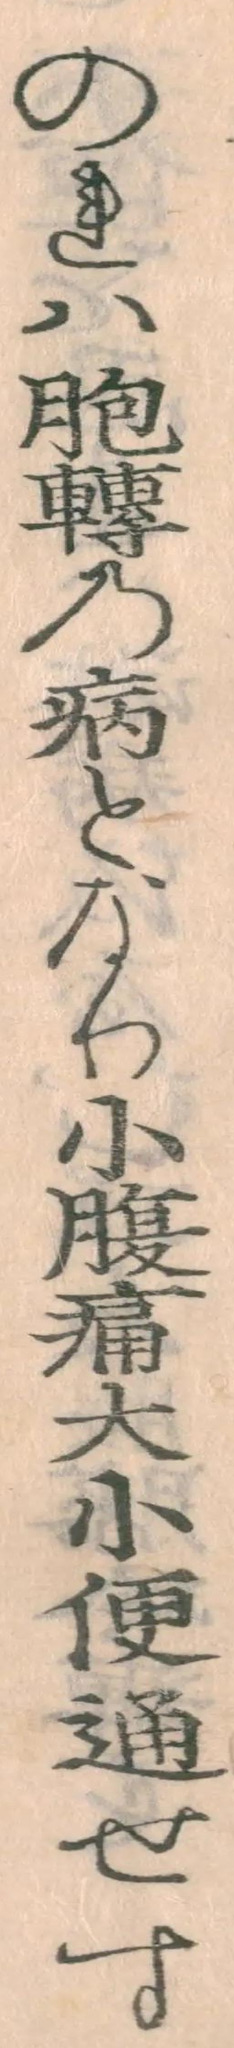のれは胞転の病となり小腹痛大小便通せす
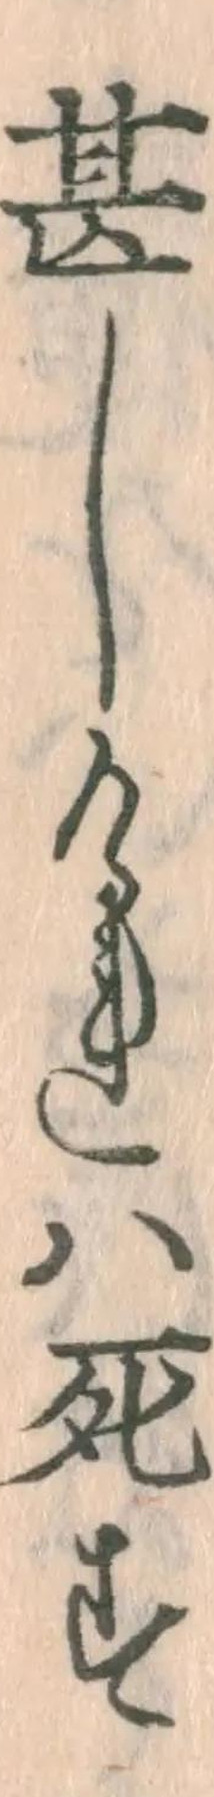甚しけれは死す
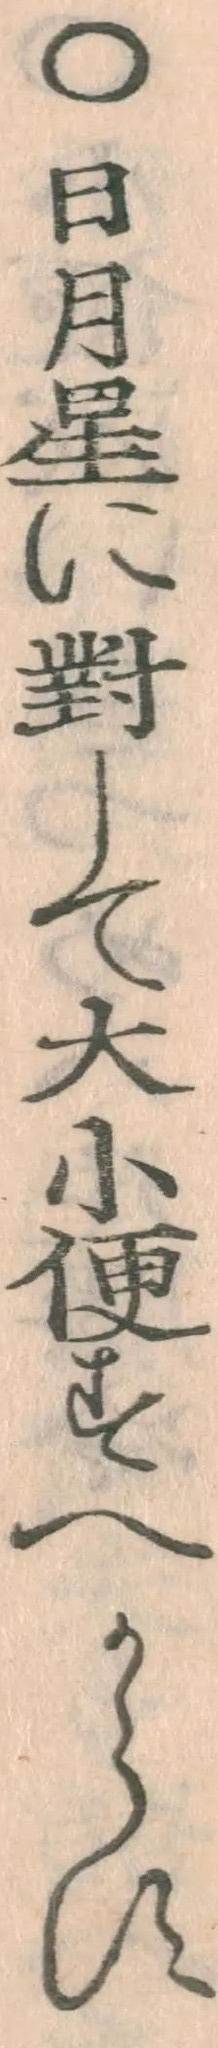〇日月星に対して大小便すへからす
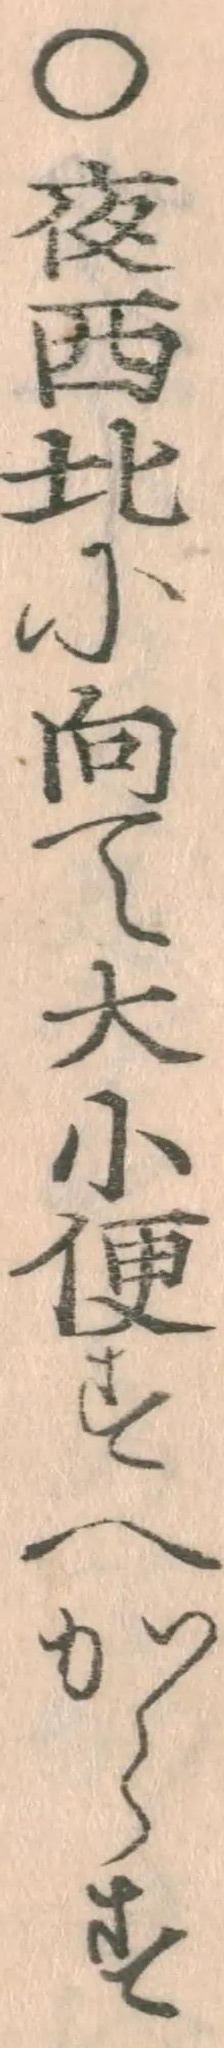〇夜西北に向て大小便すへからす
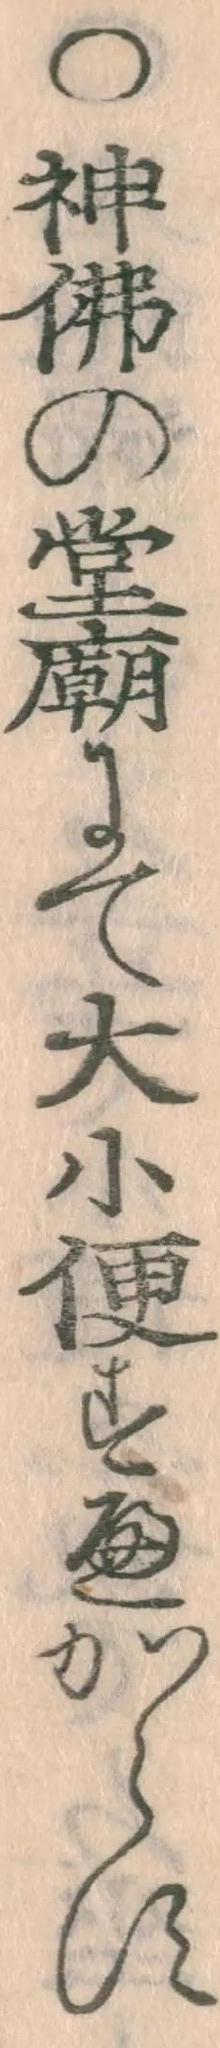〇神仏の堂廟にて大小便すへからす
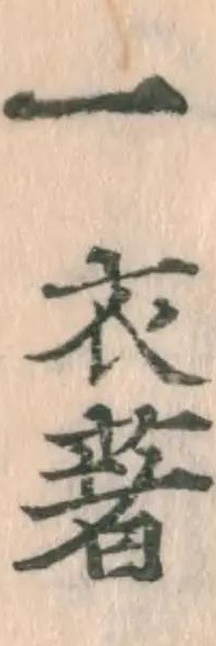一衣著
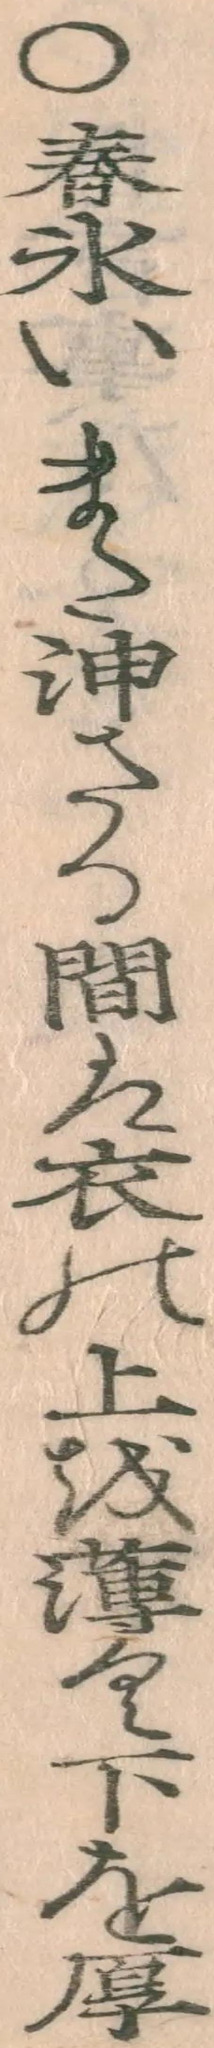〇春氷いまたさる間は衣の上を薄く下を厚
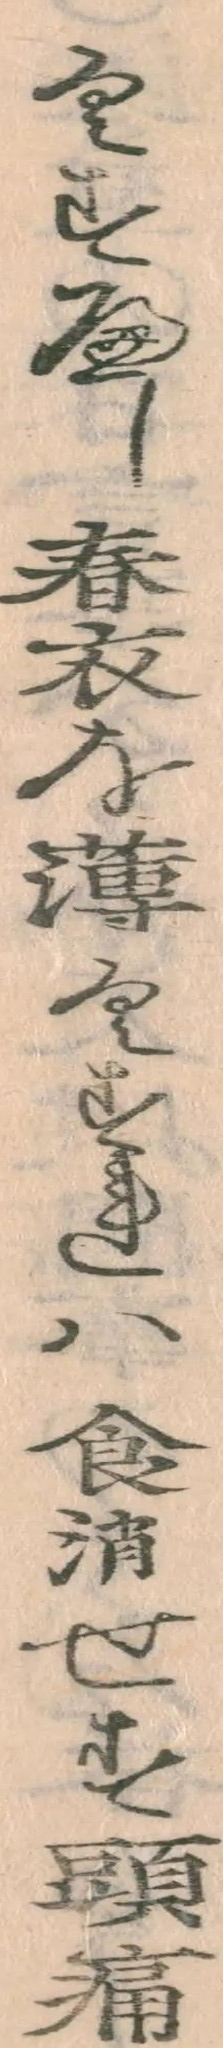くすへし春衣を薄くすれは食消せす頭痛
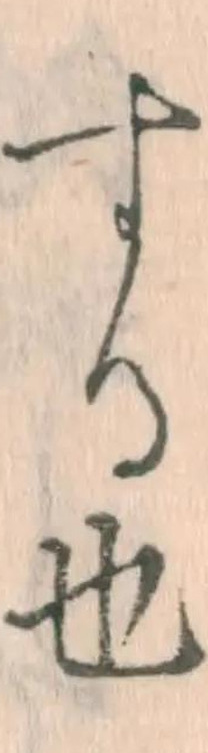する也
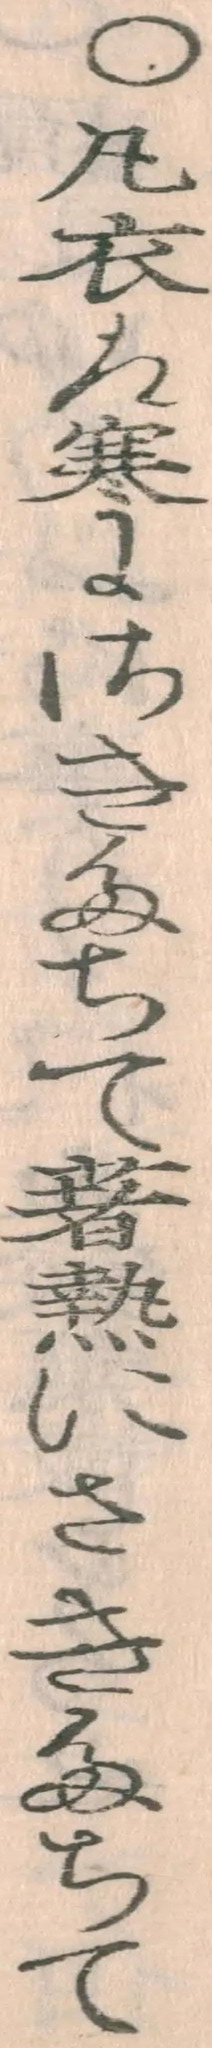〇凡衣は寒にさきたちて著熱にさきたちて
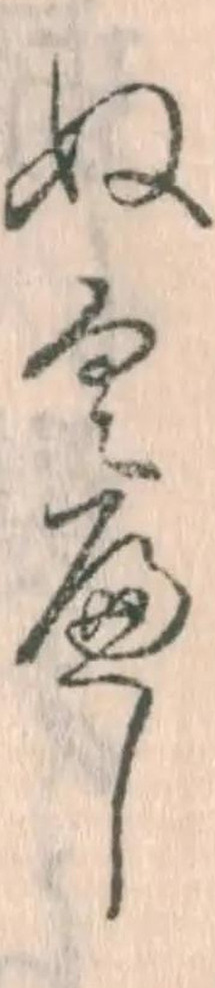ぬくへし
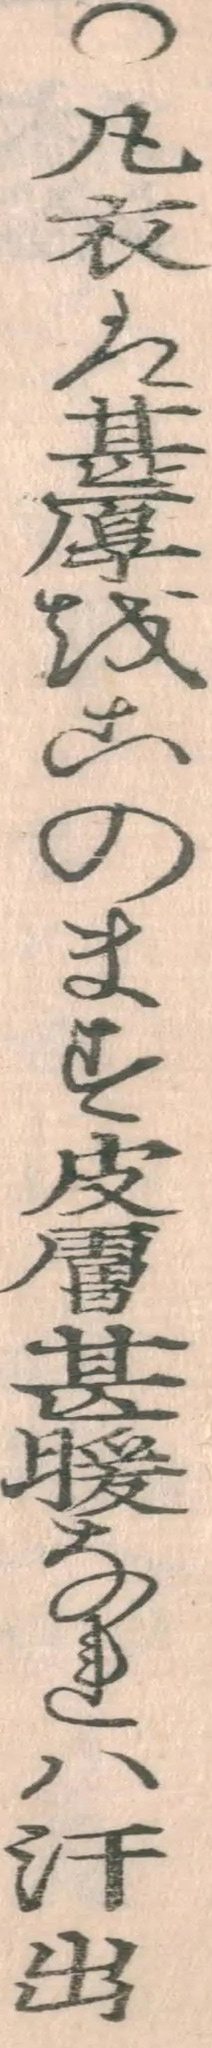〇衣は甚厚をこのます皮膚甚暖なれは汗出
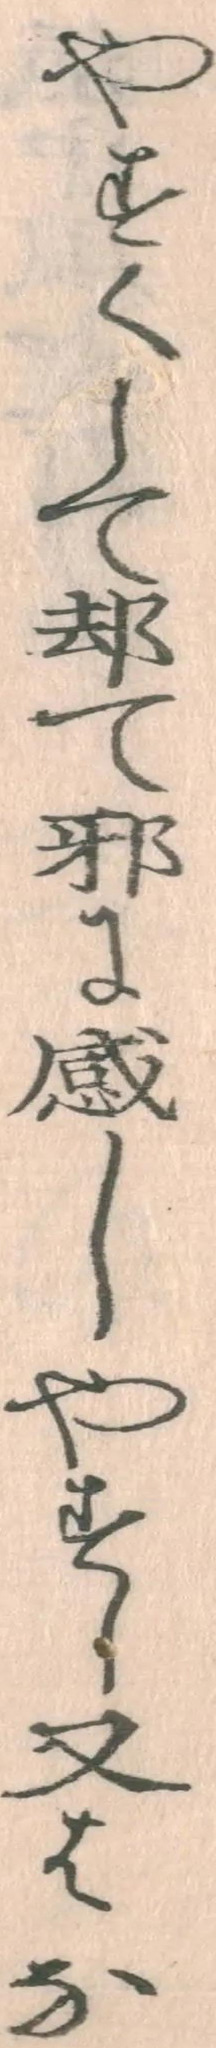やすくして却て邪に感しやすし又はな
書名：延壽撮要
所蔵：国立国会図書館 National Diet Library, JAPAN
